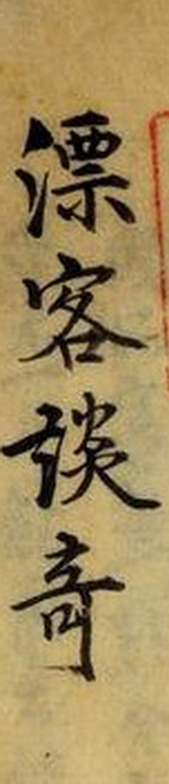漂客談奇

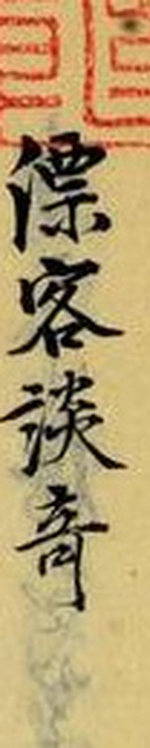漂客談奇
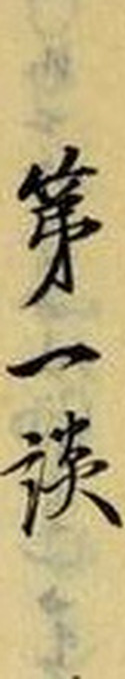第一談
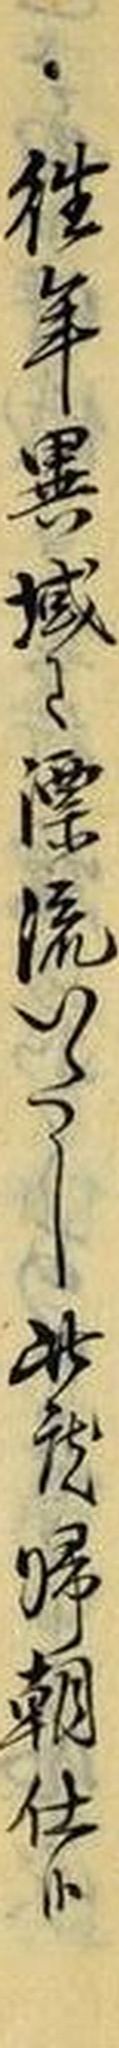往年異域に漂流いたし此度帰朝仕候
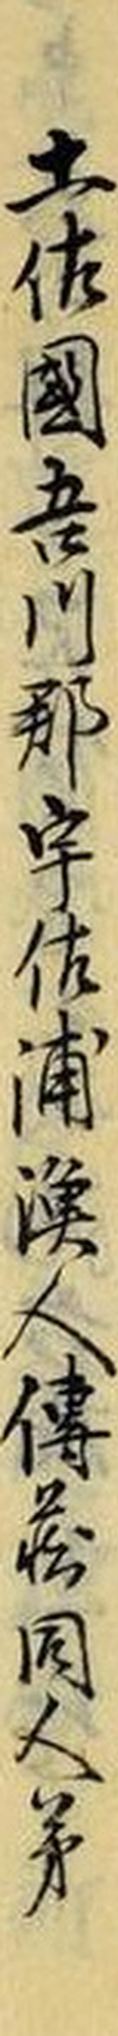土佐國阿吾川郡宇佐浦漁人傳蔵同人弟
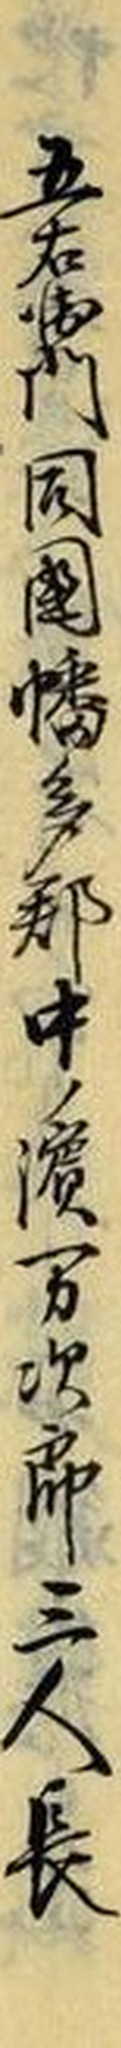五右衛門同國幡多郡中ノ濵万次郎三人長
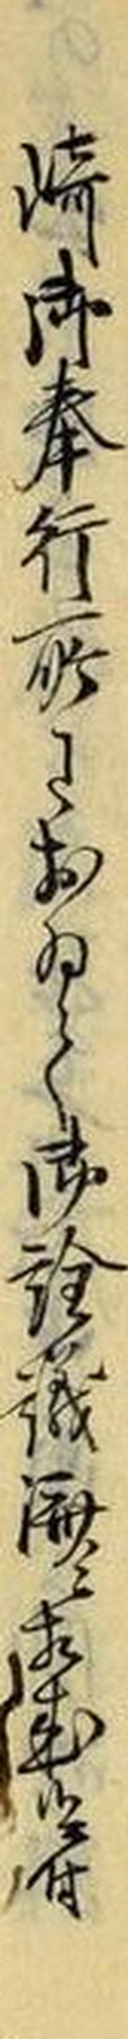崎御奉行所におゐて御詮議ニ相成候ニ付
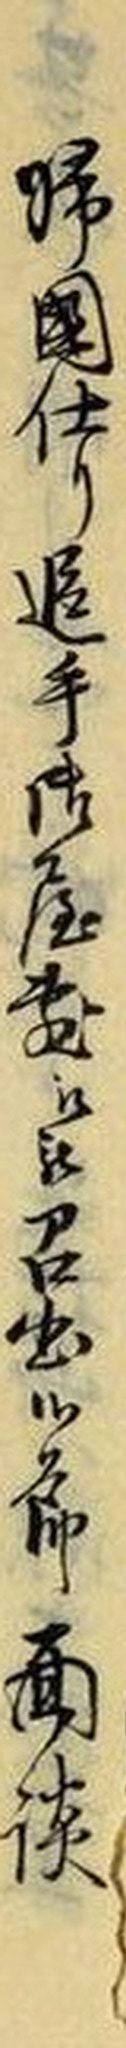帰國仕り追手御屋敷江被召出候節面談
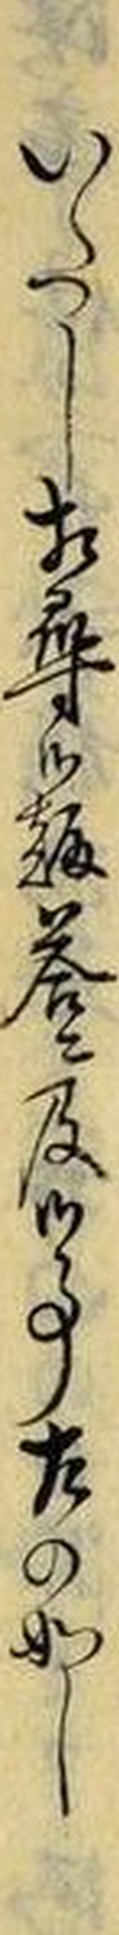いたし相尋候趣答ニ及候事左の如し
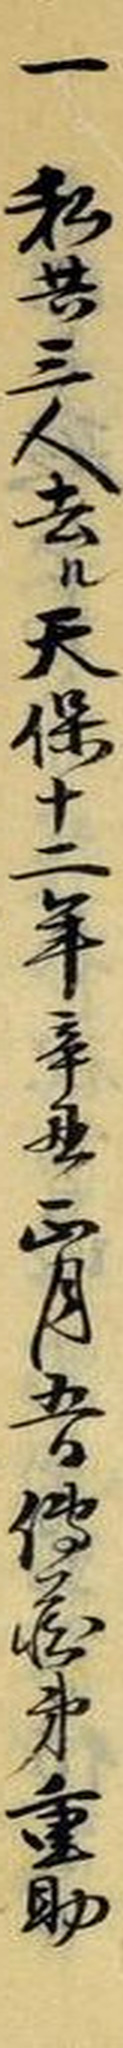一私共三人去ル天保十二年辛丑正月五日傳蔵弟重助
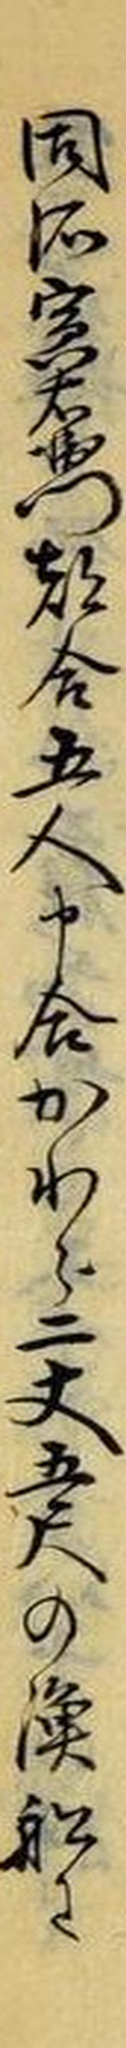同所寅右衛門都合五人申合かわらニ丈五尺の漁船に
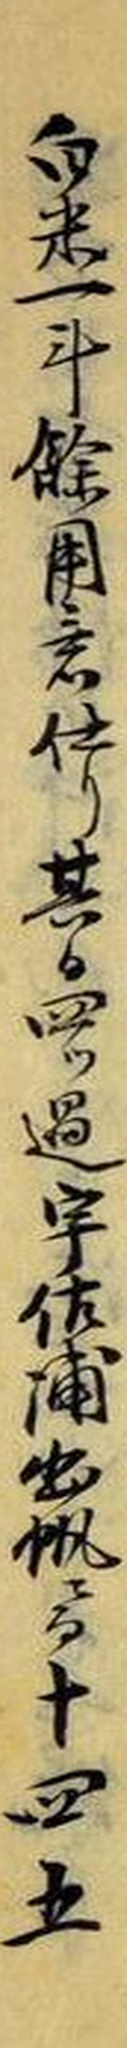白米一斗餘用意仕り其日四ツ過宇佐浦出帆ニ而十四五

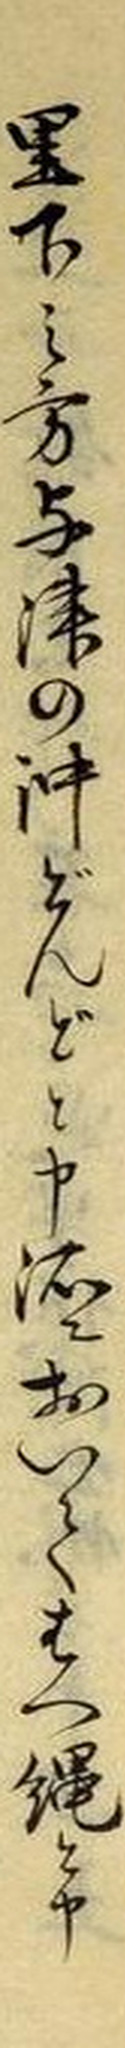里下之方与津の沖どんどと申所ニおいてはへ縄と申
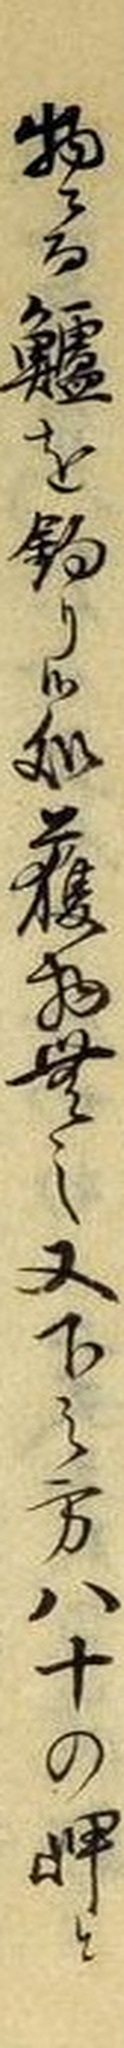物ニ而鱸を釣り候処獲物無之又下之方八十の岬と
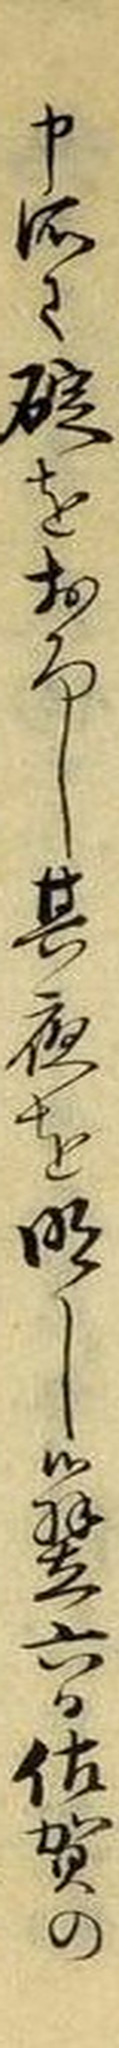申所に碇をおろし其夜を明し候翌六日佐賀の
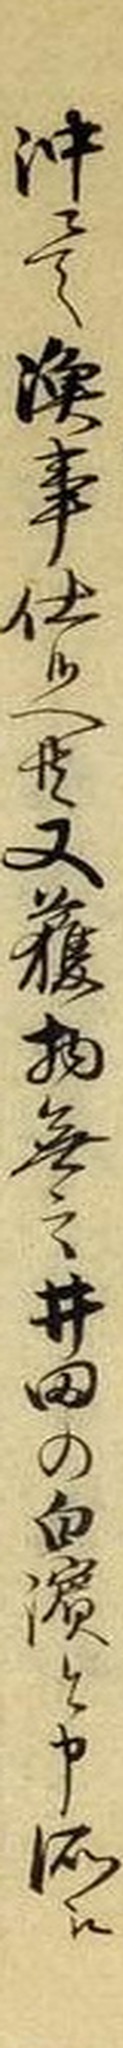沖ニて漁事仕候へ共又獲物無之井田の白濱と申所江
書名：漂客談奇（備考雑録写8）
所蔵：福井県文書館 Fukui Prefectural Archives
